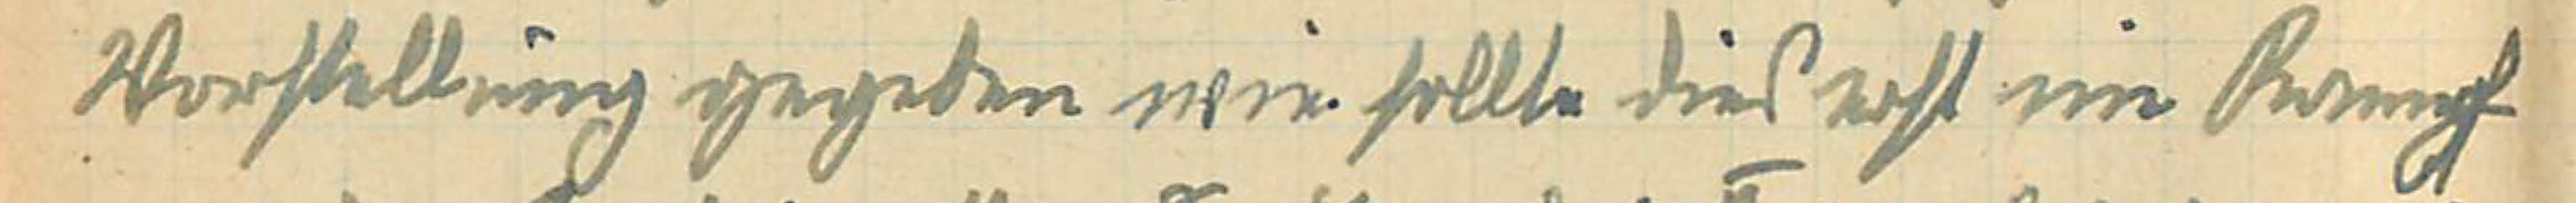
Vorstellung gegeben wie sollte dies erst im Kampf
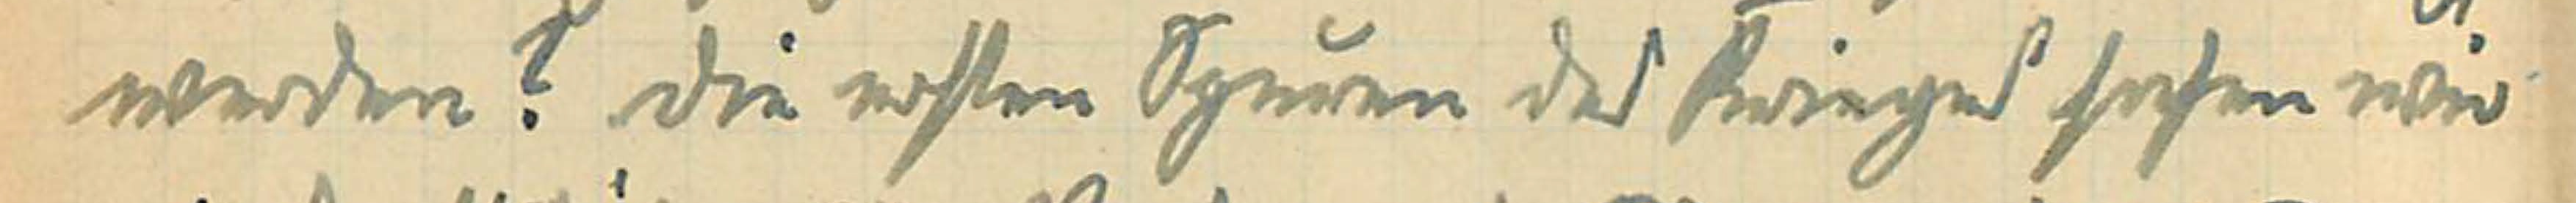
werden? Die ersten Spuren des Krieges sahen wir
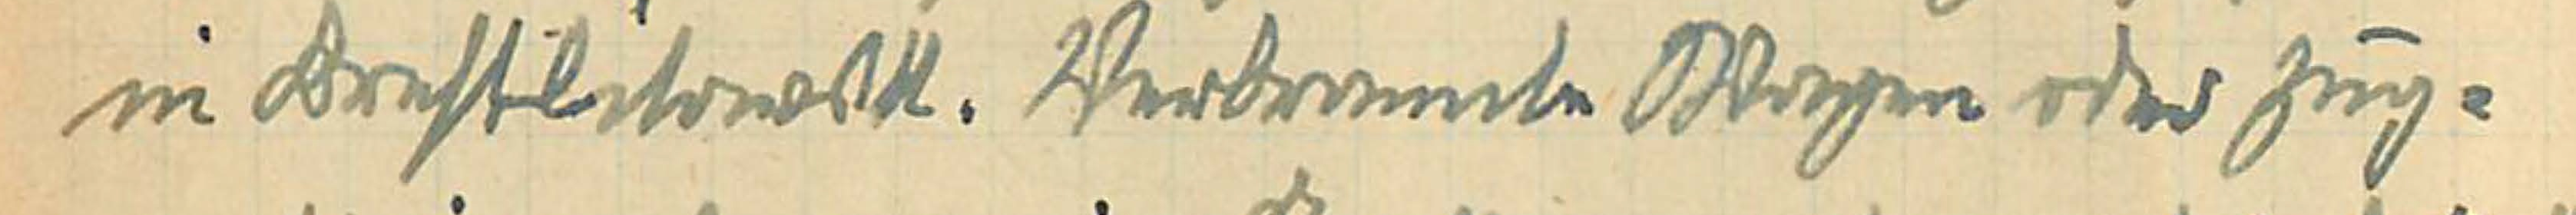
in Brestlitowsk. Verbrannte Wagen oder Zug-
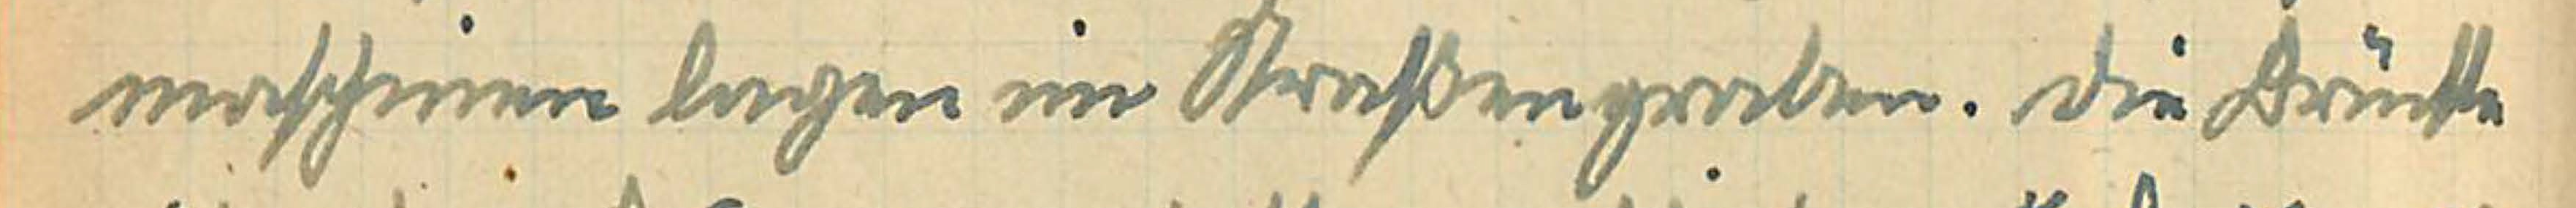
maschinen lagen im Straßengraben. Die Brücke
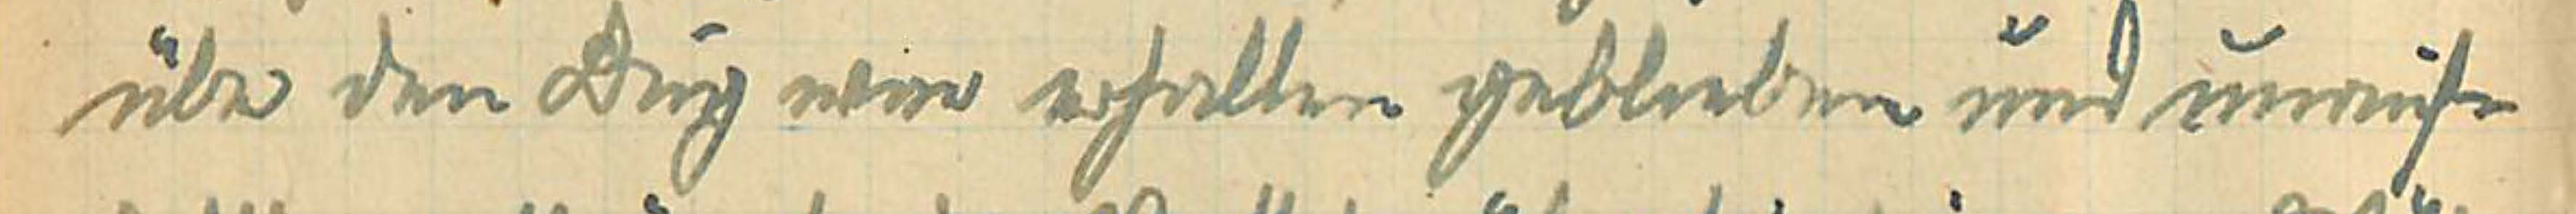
über den Bug war erhalten geblieben und unauf-
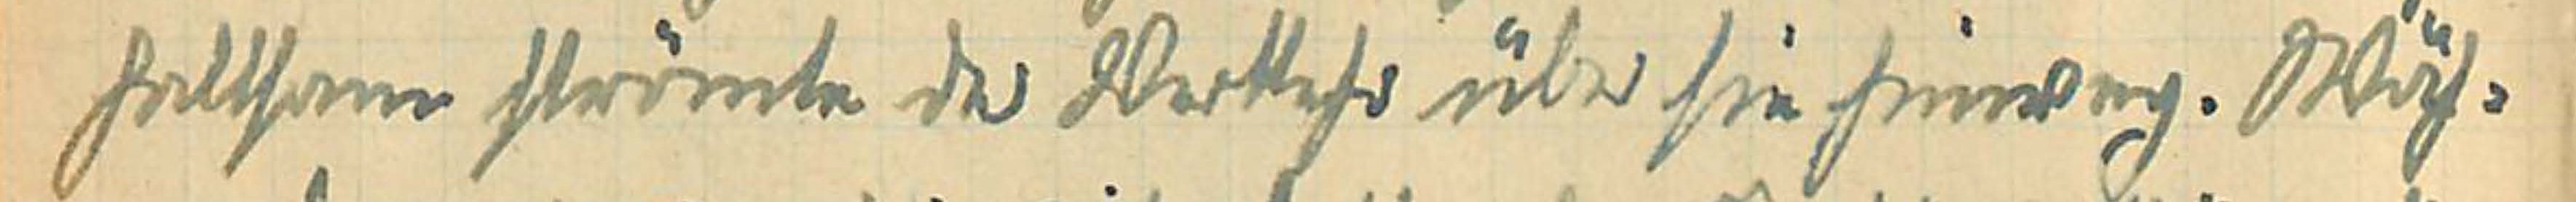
haltsam strömte der Verkehr über sie hinweg. Wäh-
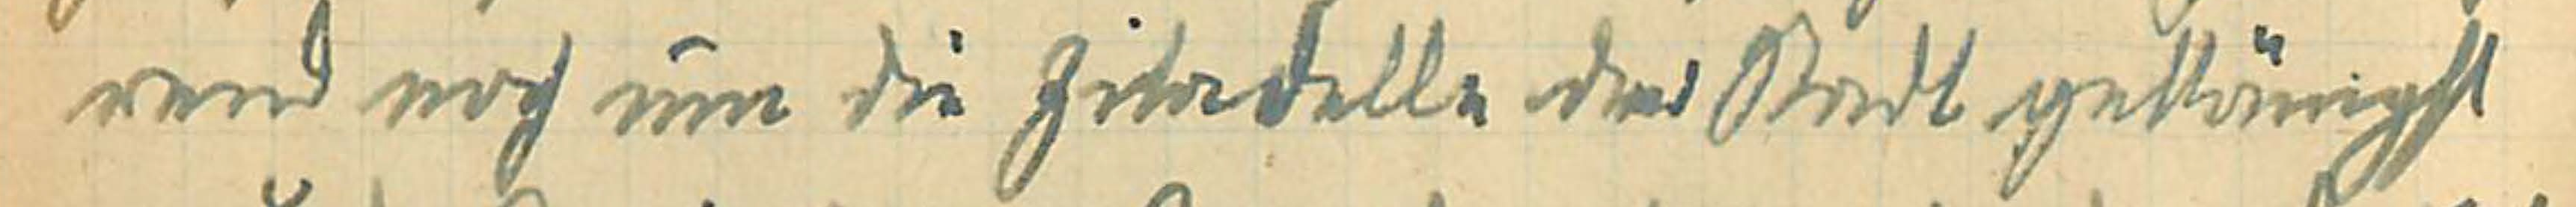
rend noch um die Zitadelle der Stadt gekämpft
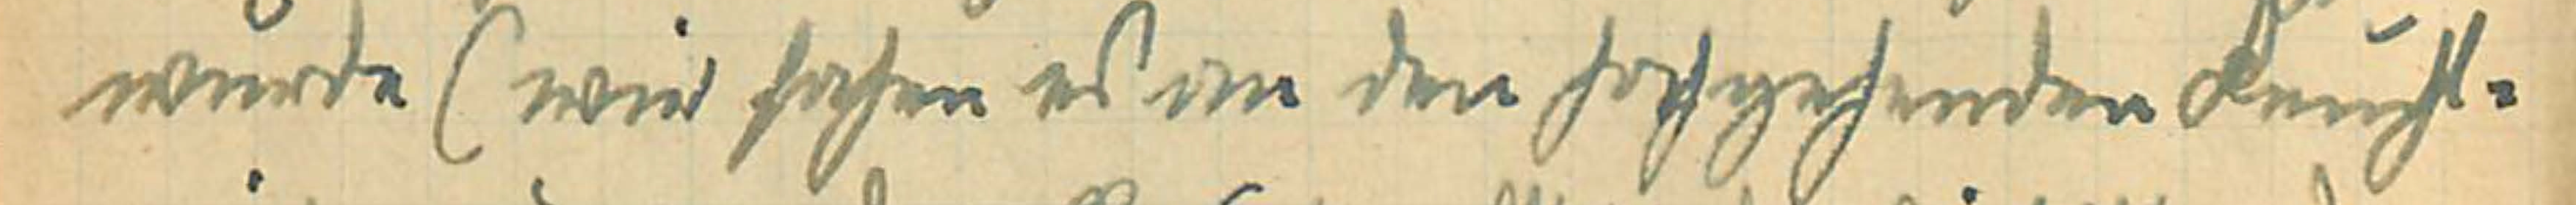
wurde (wir sahen es an den hochgehenden Leucht-
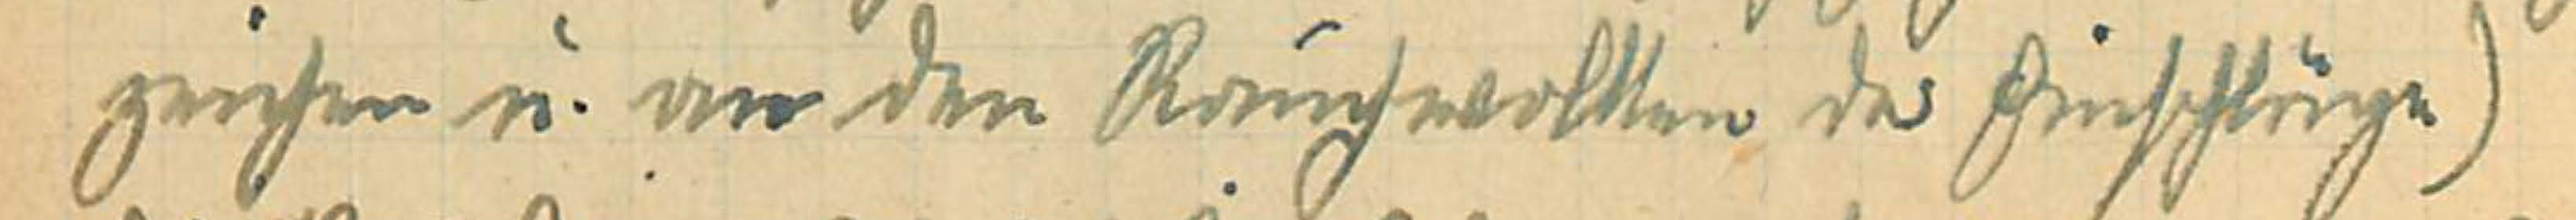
zeichen u. an den Rauchwolken der Einschläge)
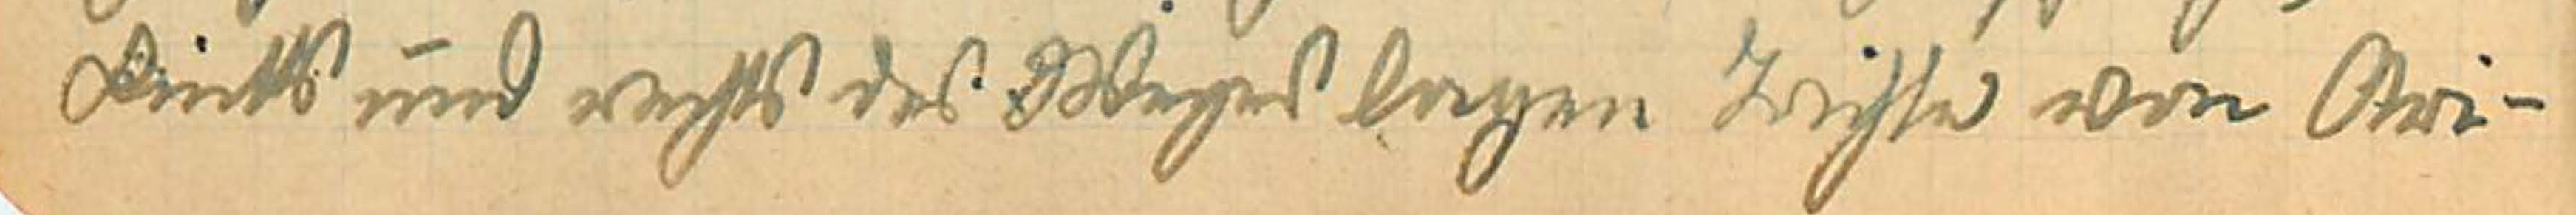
Links und rechts des Weges lagen Trichter von Ari-
